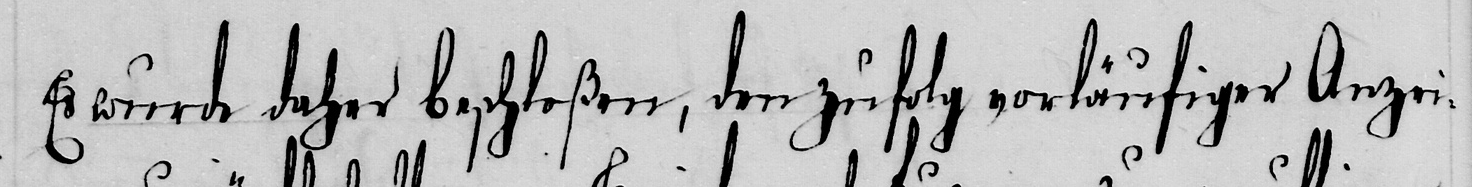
Es wurde daher beschloßen, den zufolg vorläufiger Anzei¬
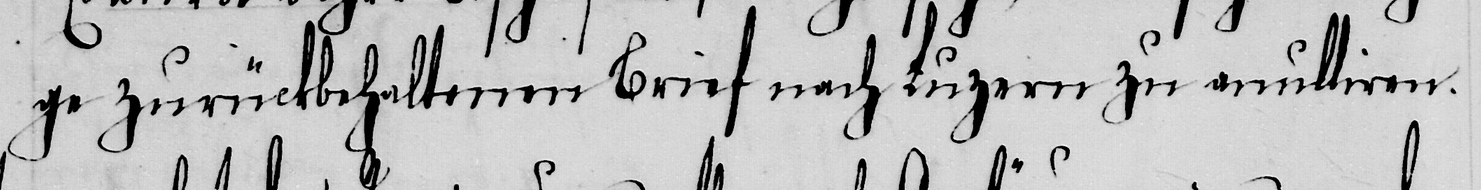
ge zurückbehaltenen Brief nach Luzern zu anulliren.
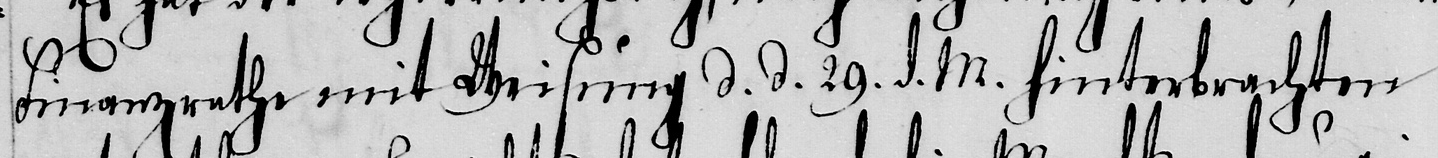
Finanzrathe mit Weisung d. d. 29. d. M. hinterbrachten
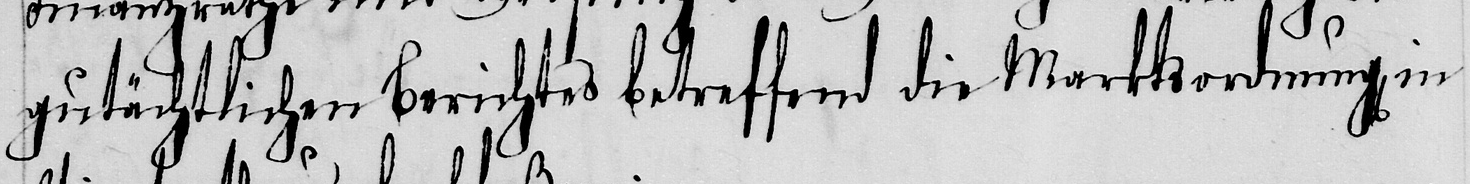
gutächtlichen Berichtes betreffend die Marktsordnung in
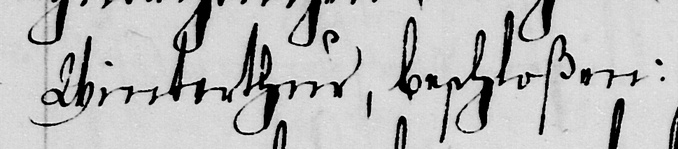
Winterthur, beschloßen:
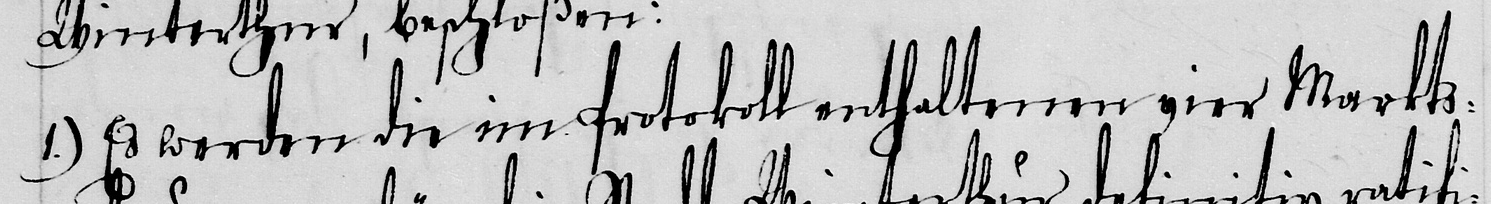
1.) Es werden die im Protokoll enthaltenen vier Markts¬
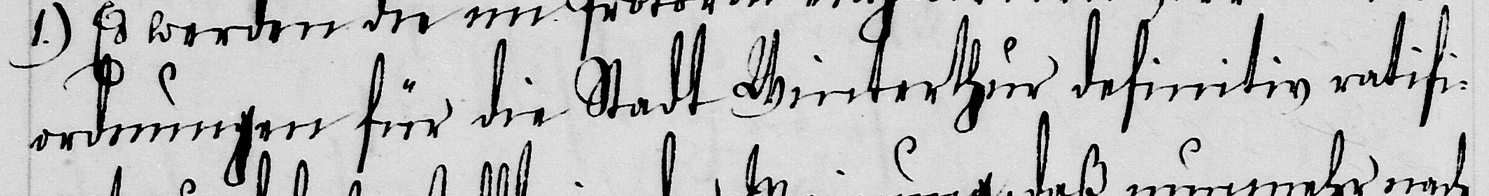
ordnungen für die Stadt Winterthur definitiv ratifi¬
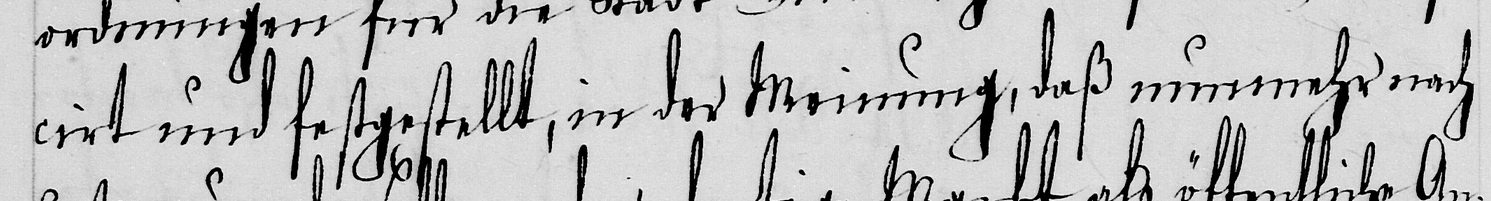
cirt und festgestellt, in der Meinung, daß nunmehr nach
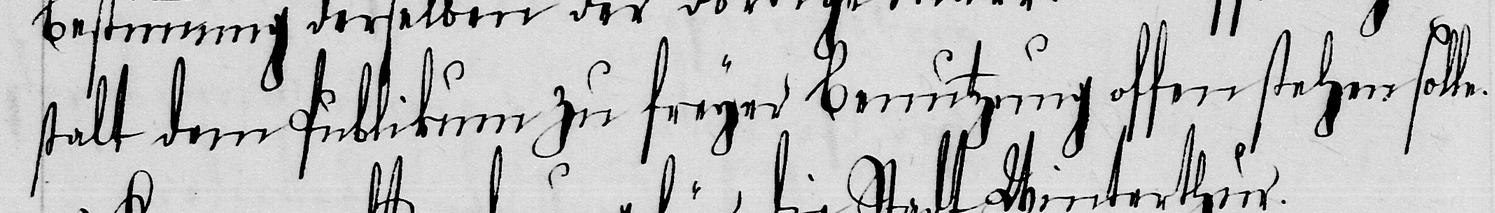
stalt dem Publikum zu freyer Benutzung offen stehen sol¬
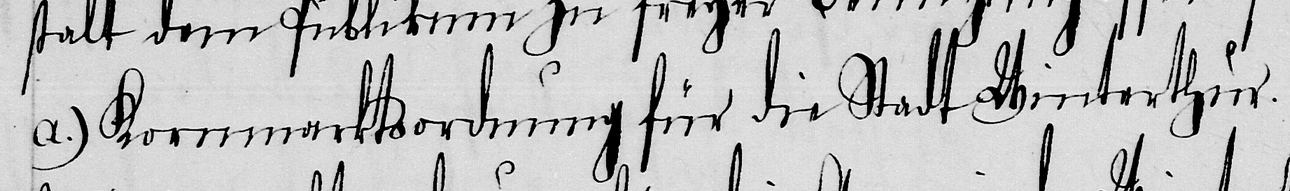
a.) Kornmarktsordnung für die Stadt Winterthur.
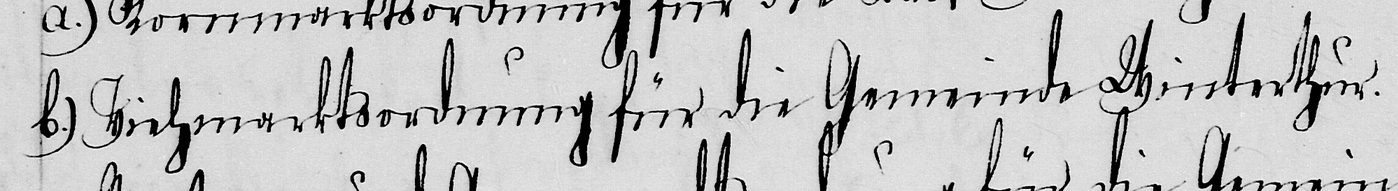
b.) Viehmarktsordnung für die Gemeinde Winterthur.
